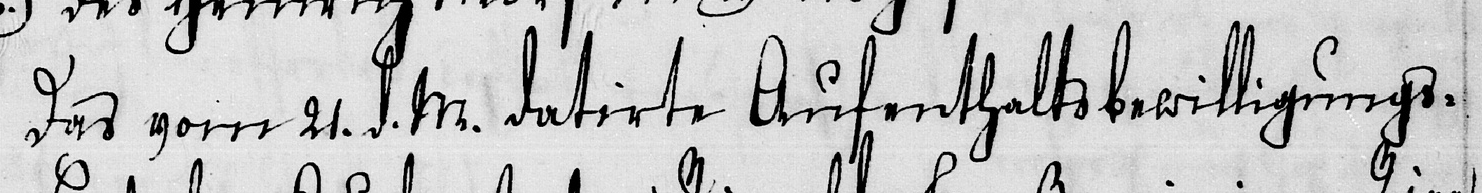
Das vom 21. d. M. datirte Aufenthaltsbewilligungs¬
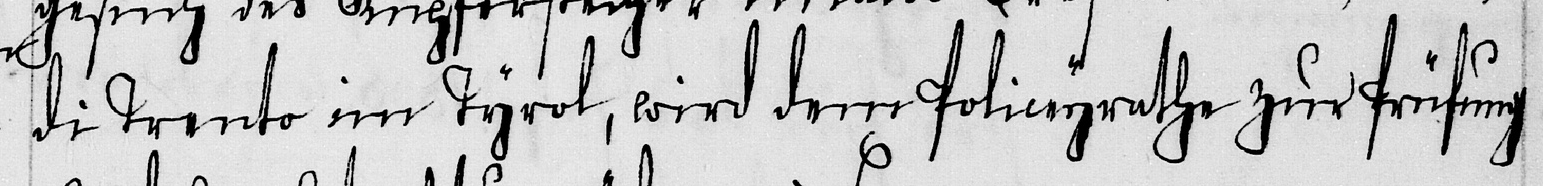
di Trento im Tyrol, wird dem Policeyrathe zur Prüfung
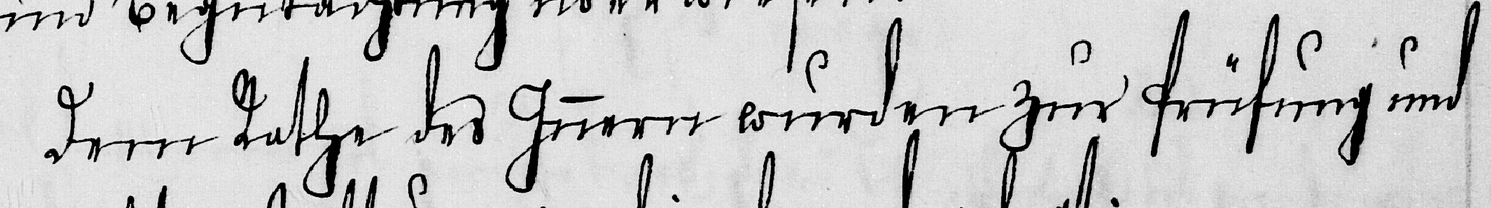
Dem Rathe des Innern wurden zur Prüfung und
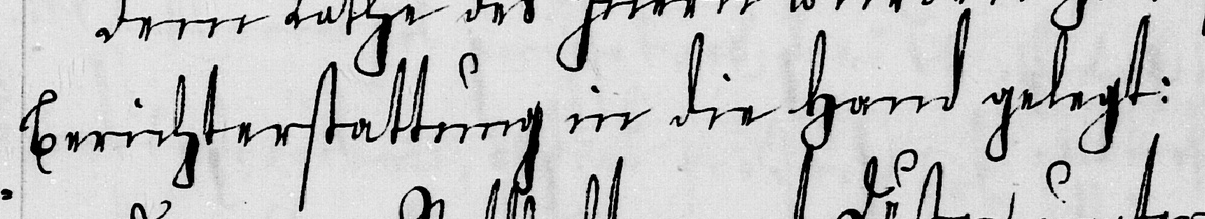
Berichterstattung in die Hand gelegt:
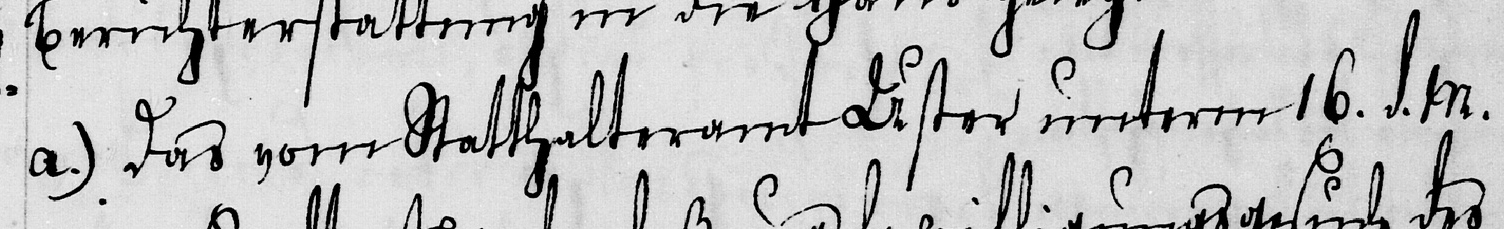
a.) Das vom Statthalteramt Uster unterm 16. d. M.
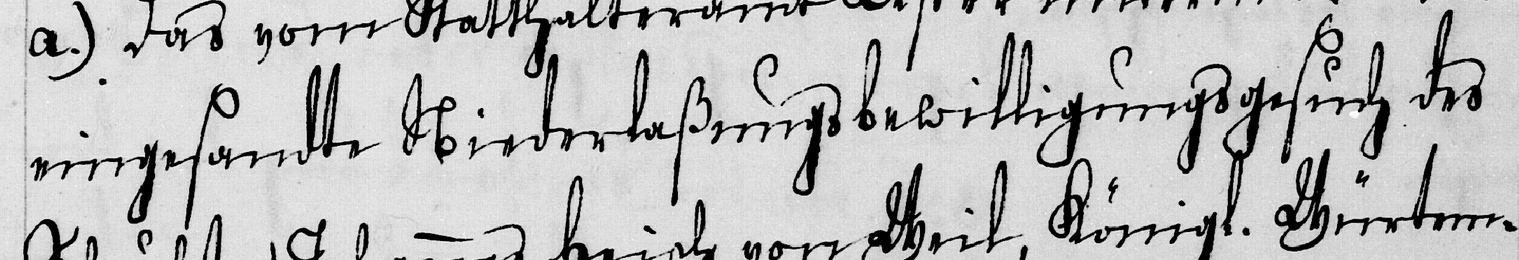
eingesandte Niederlaßungsbewilligungsgesuch des
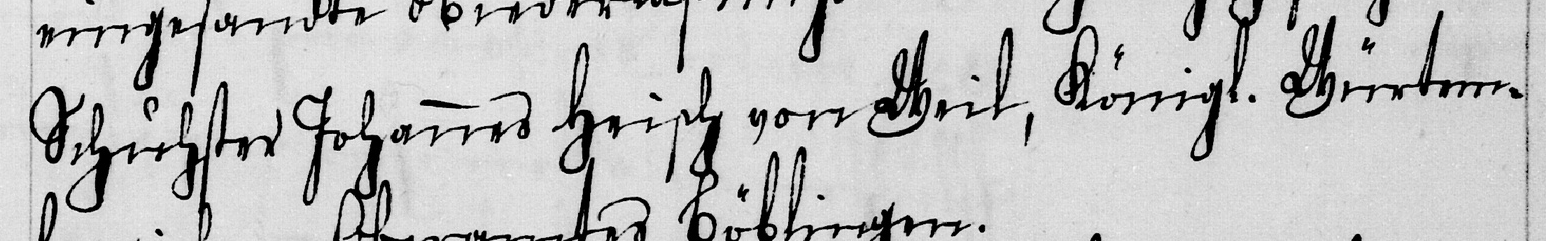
Schuhster Johannes Heisch von Weil, Königl. Würtem¬
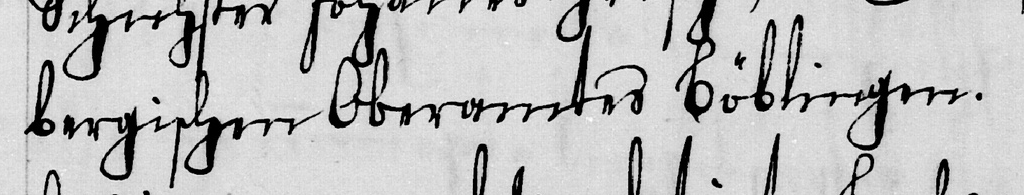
bergischen Oberamtes Böblingen.
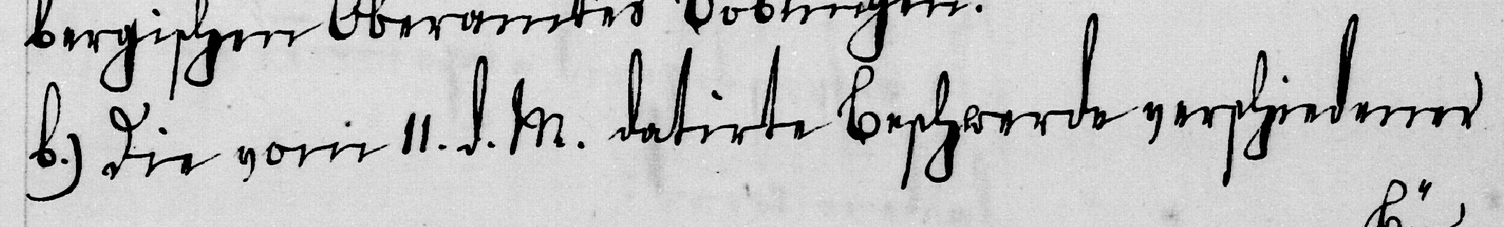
b.) Die vom 11. d. M. datirte Beschwerde verschiedener
